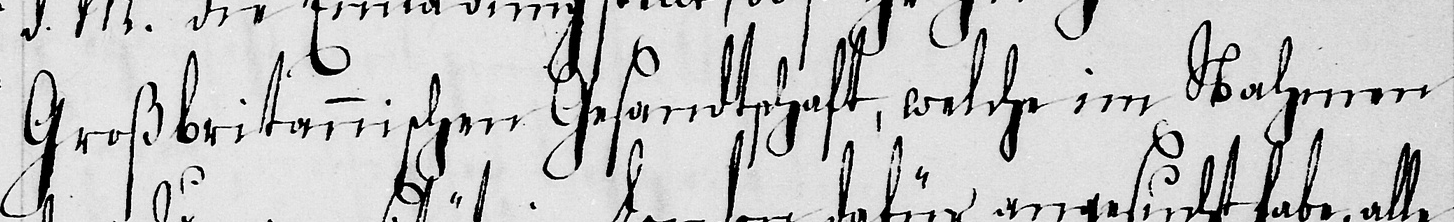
Großbritannischen Gesandtschaft, welche im Nahmen
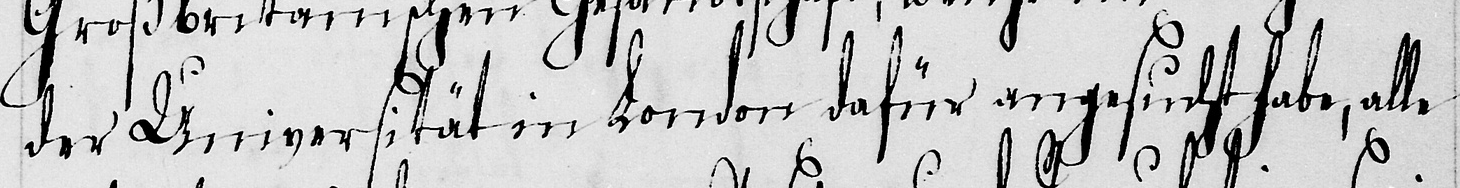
der Universität in London dafür angesucht habe, alle
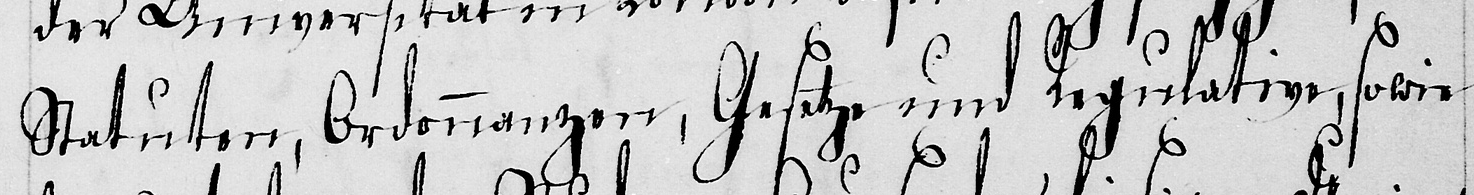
Statuten, Ordonnanzen, Gesetze und Regulative, sowie
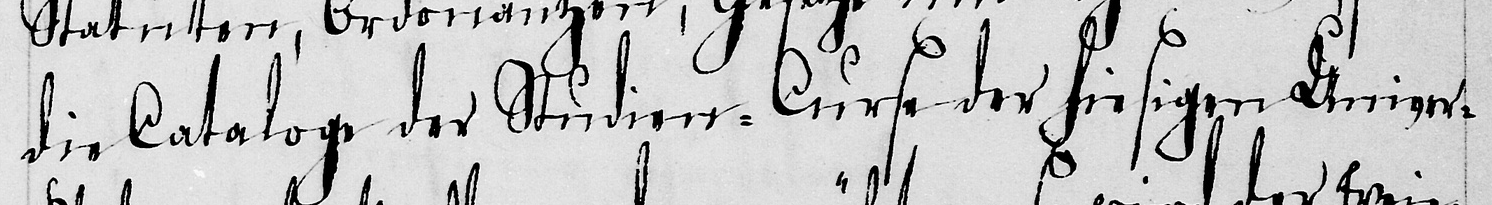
die Cataloge der Studien-Curse der hiesigen Univer¬
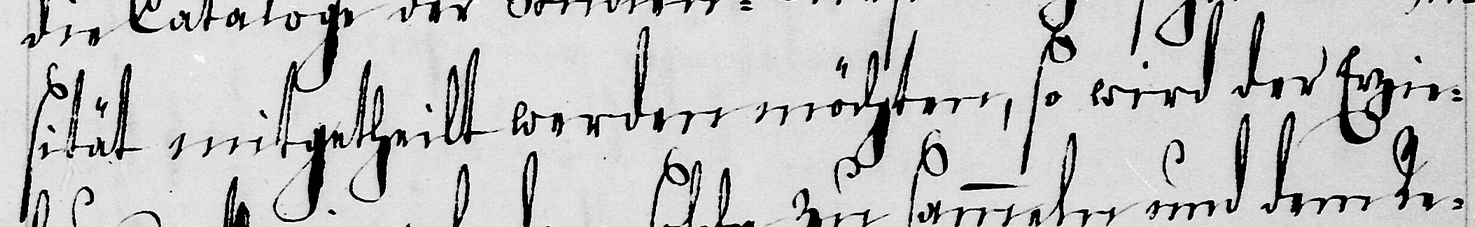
sität mitgetheilt werden möchten, so wird der Erzie¬
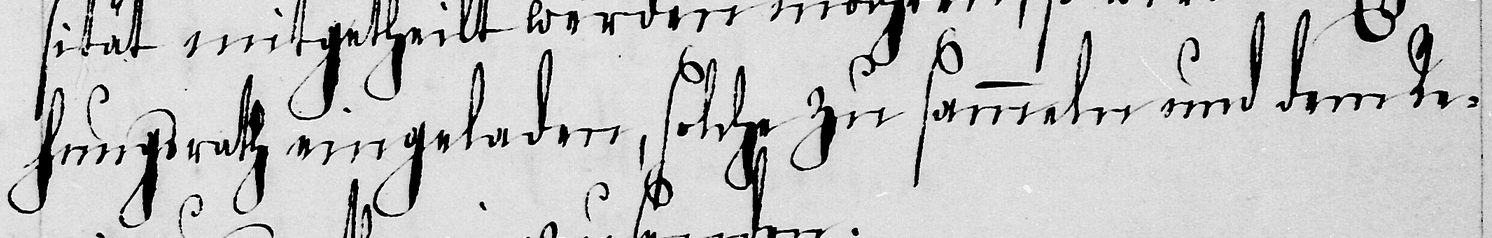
hungsrath eingeladen, solche zu sammeln und dem Re¬
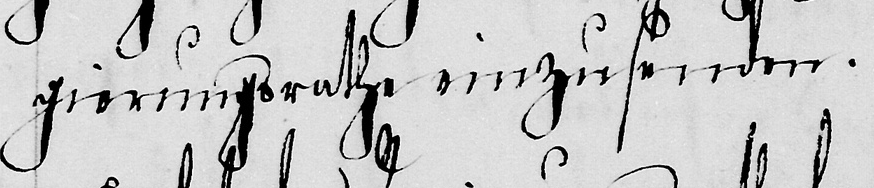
gierungsrathe einzusenden.
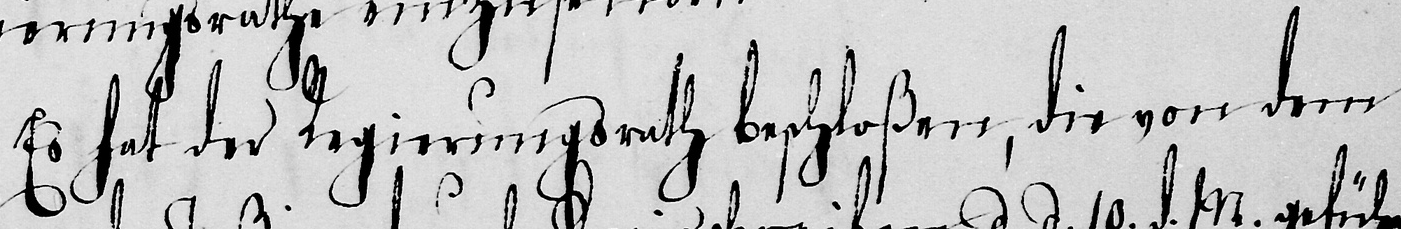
Es hat der Regierungsrath beschloßen, die von dem
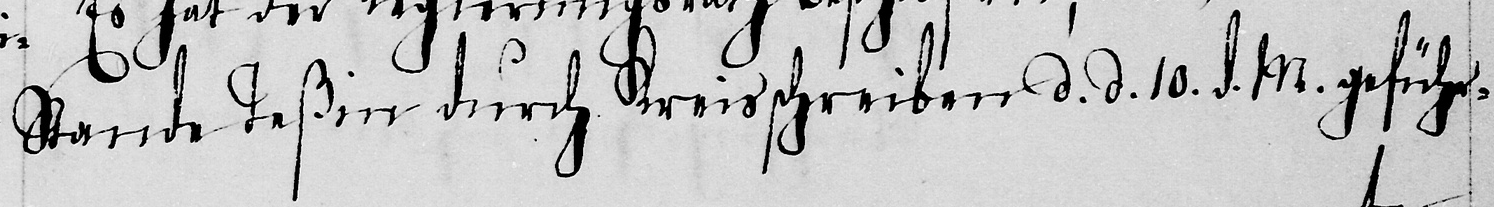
Stande Teßin durch Kreisschreiben d.d. 10. d. M. geführ-
